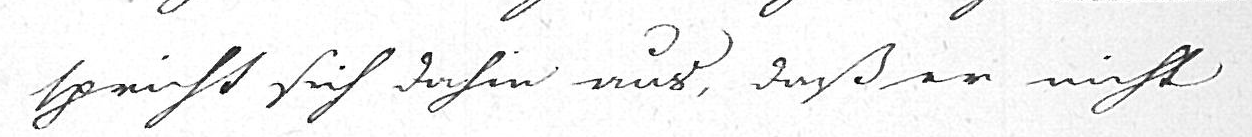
spricht sich dahin aus, daß er nicht
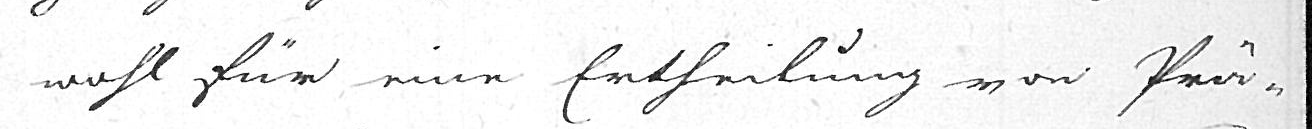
wohl für eine Ertheilung von Prä-
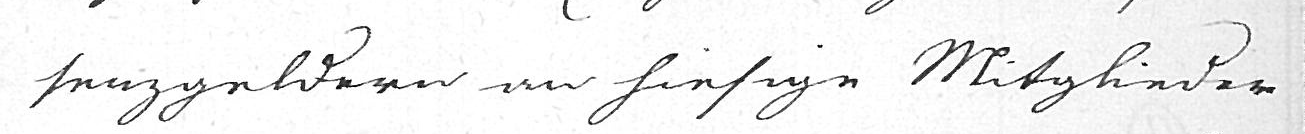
senzgeldern an hiesige Mitglieder
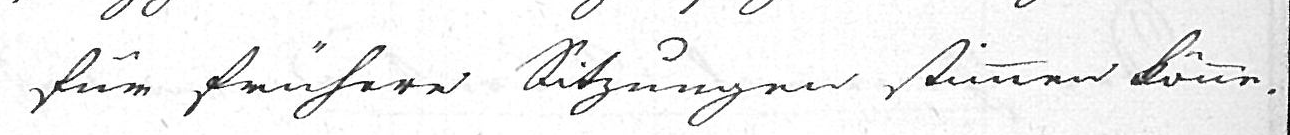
für frühere Sitzungen stimmen könne.
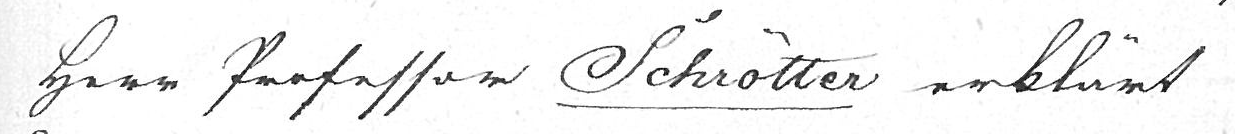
Herr Professor Schrötter erklärt
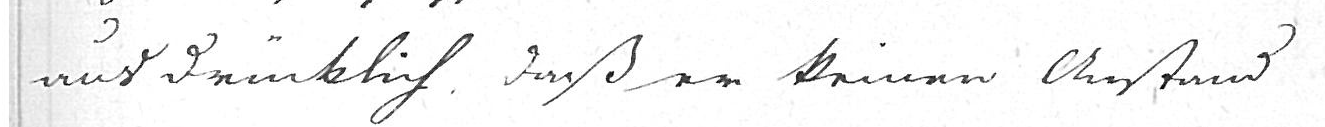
ausdrücklich, daß er keinen Anstand
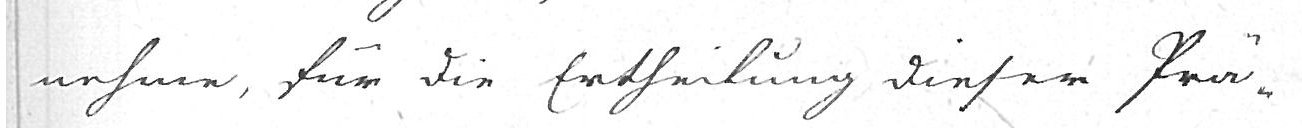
nehme, für die Ertheilung dieser Prä-
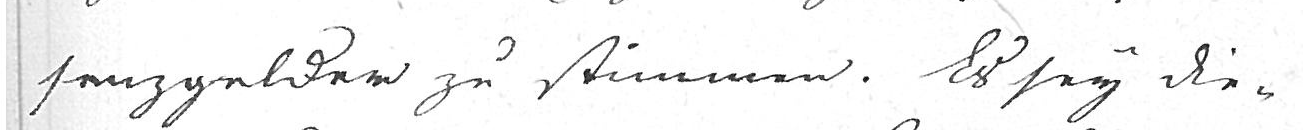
senzgelder zu stimmen. Es sey die-
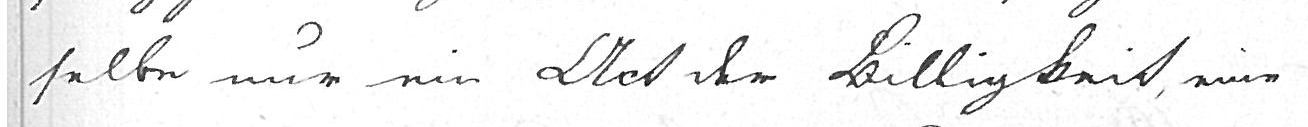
selbe nur ein Act der Billigkeit, eine
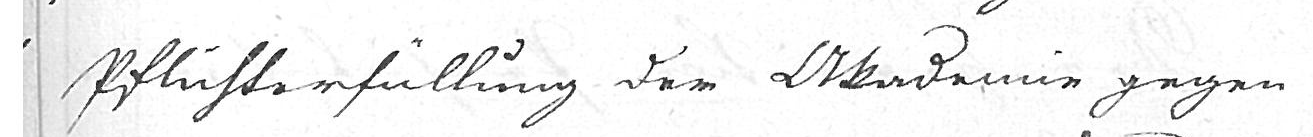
Pflichterfüllung der Akademie gegen
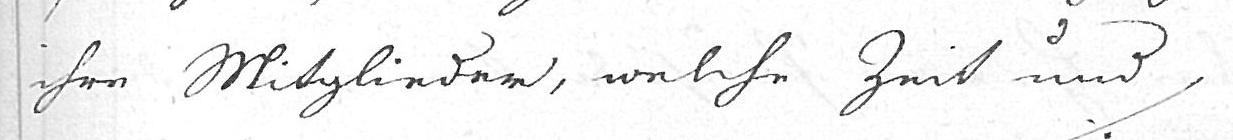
ihre Mitglieder, welche Zeit und
